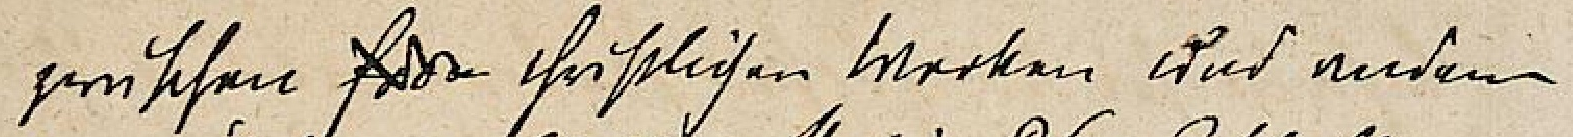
zwischen from christlichen Werken und andern
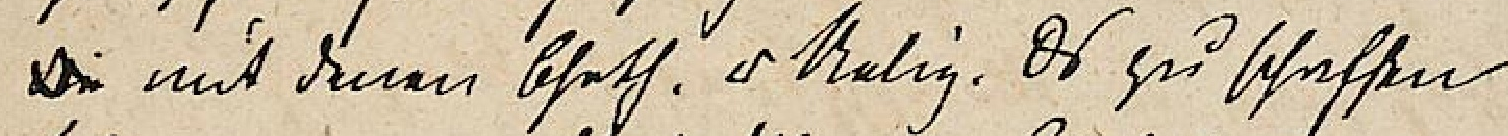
die mit denen Chrth. u. Relig. os zu schaffen
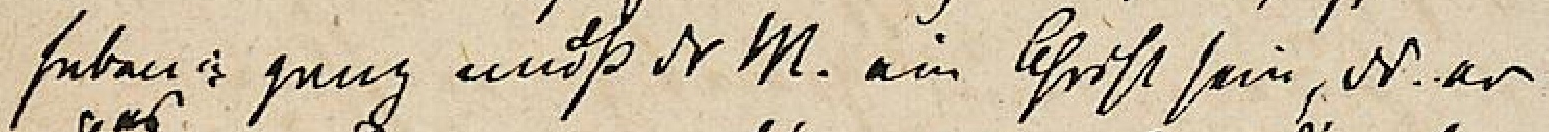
haben: ganz muß dr M. ein Christ sein, od. er
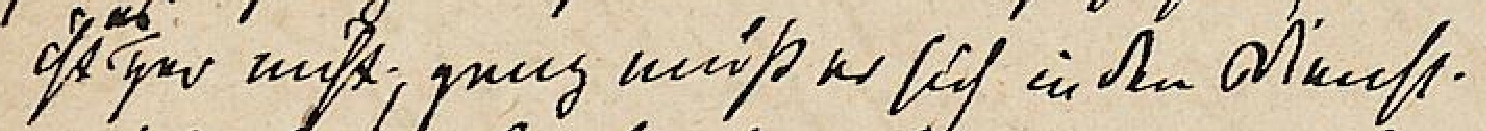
ist gar nicht; ganz muß er sich in den Dienst
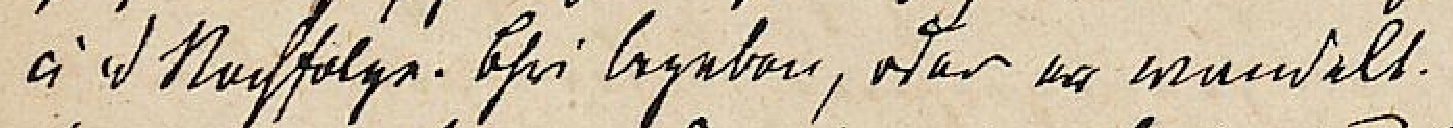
u. d. Nachfolg. Chri. begebn, oder er wandelt
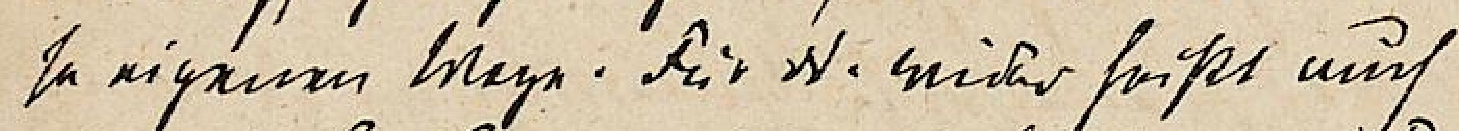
sn eigenen Wege. Für od. wider heißt auch
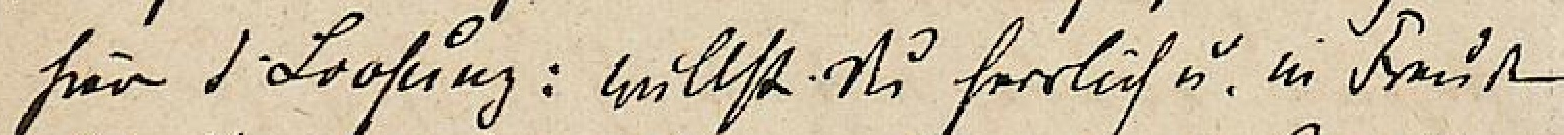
hier d. Loosung: Willst du herrlich u in Freude
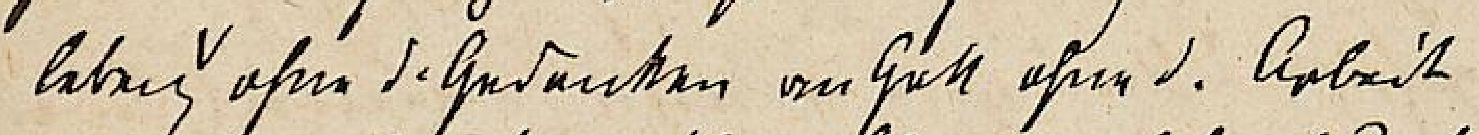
leben, ohne d. Gedanken an Gott ohne d. Arbeit
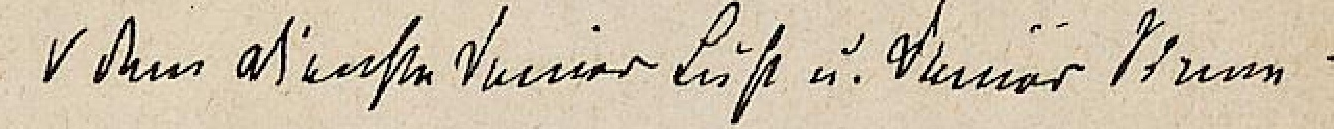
V dem Dienste deiner Lust u. deiner Sinne
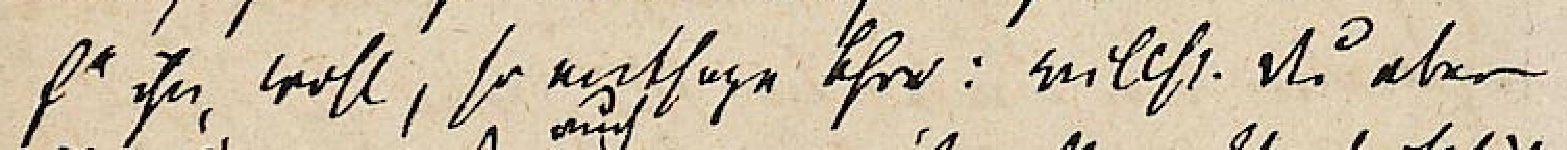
fü ih, voll, so entsage Chri: Willst du aber
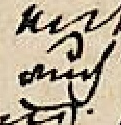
auch
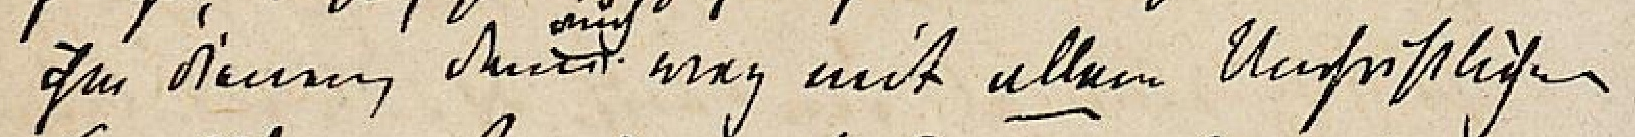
ihm dienen, dan weg mit allem Unchristlichen
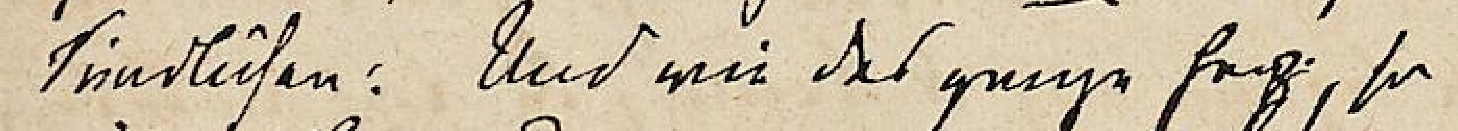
sündlichen: Und wie das ganze Herz, so
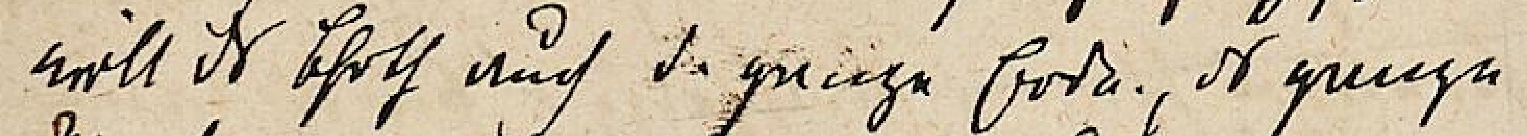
will ds Chrth auch d. ganze Erde, ds ganze
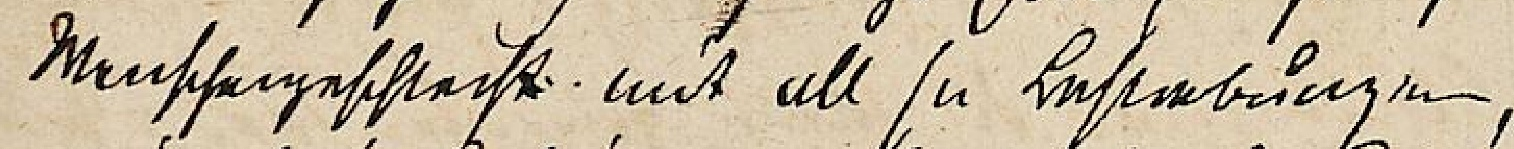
Menschengeschlecht mit all sn Bestrebungen,
